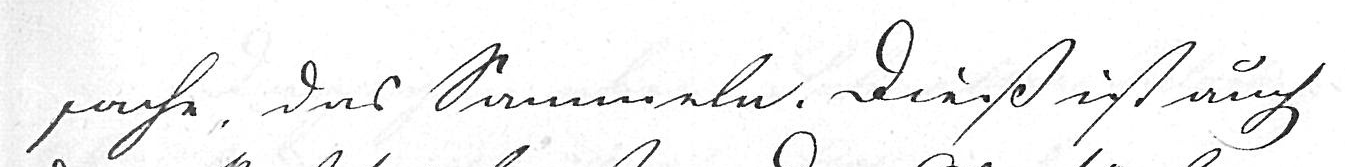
sache, das Sammeln. Dieß ist auch
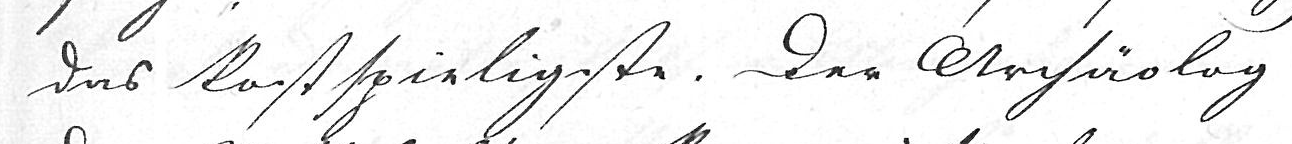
das Kostspieligste. Der Archäolog
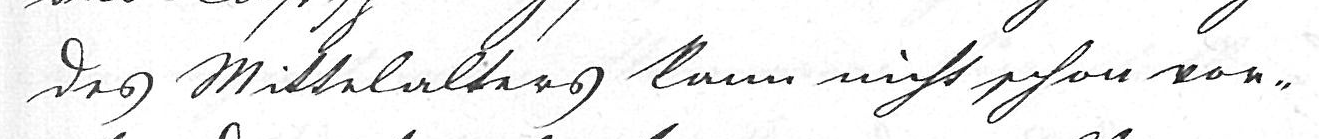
des Mittelalters kann nicht schon vor-
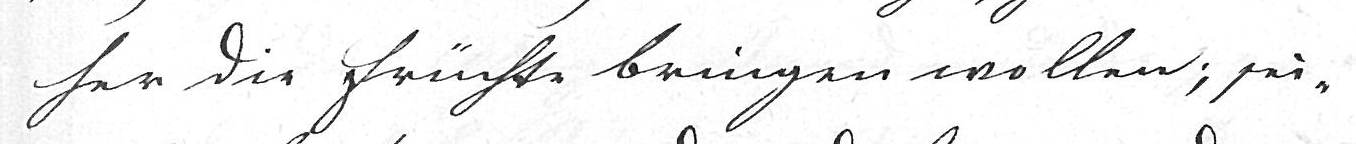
her die Früchte bringen wollen; sei-
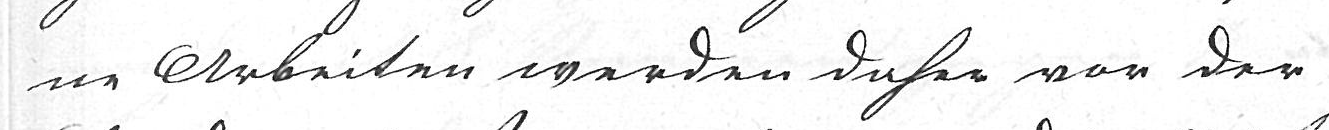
ne Arbeiten werden daher vor der
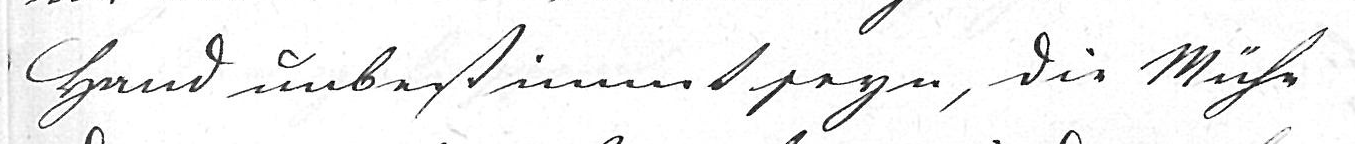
Hand unbestimmt seyn, die Mühe,
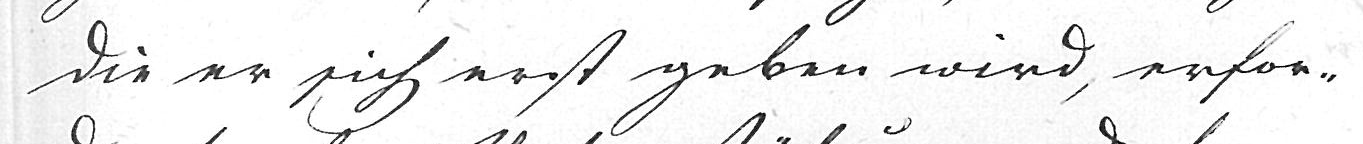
die er sich erst geben wird, erfor-
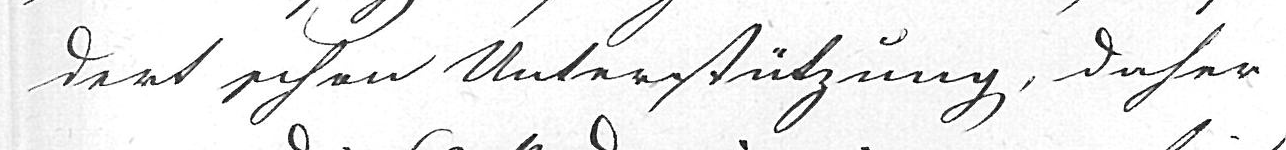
dert schon Unterstützung, daher
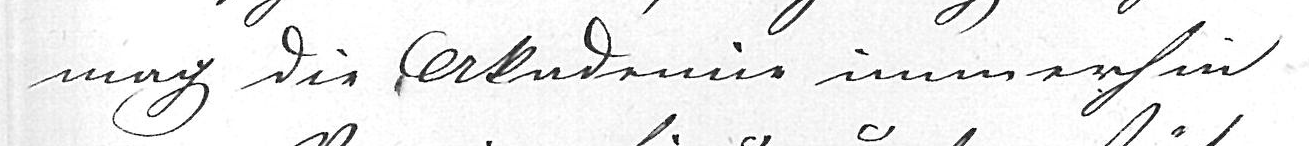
mag die Akademie immerhin
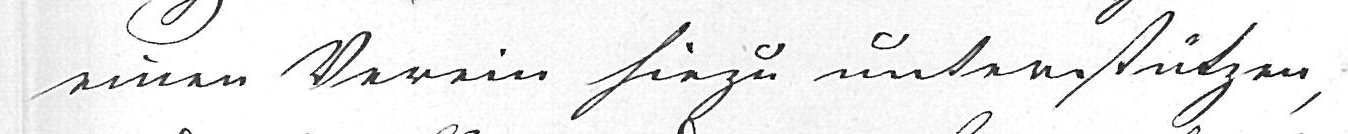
einen Verein hiezu unterstützen,
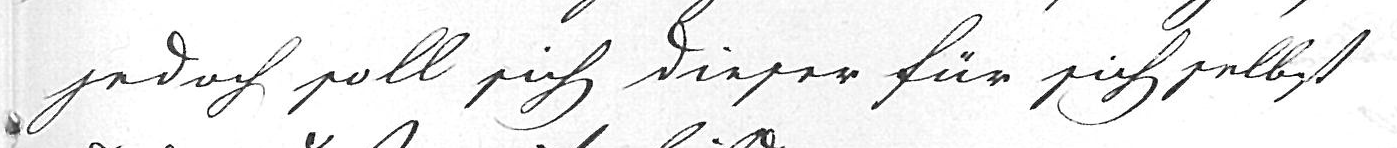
jedoch soll sich dieser für sich selbst
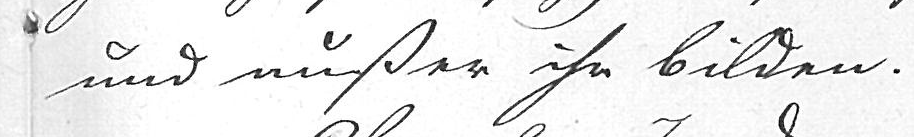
und außer ihr bilden.
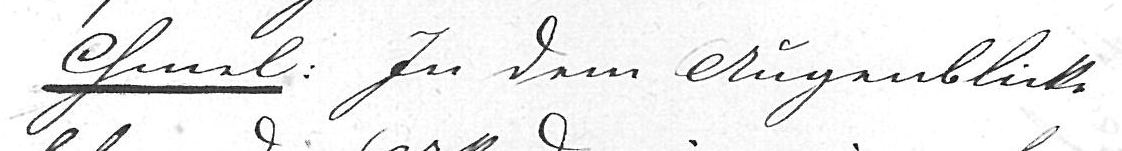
Chmel: In dem Augenblick,
